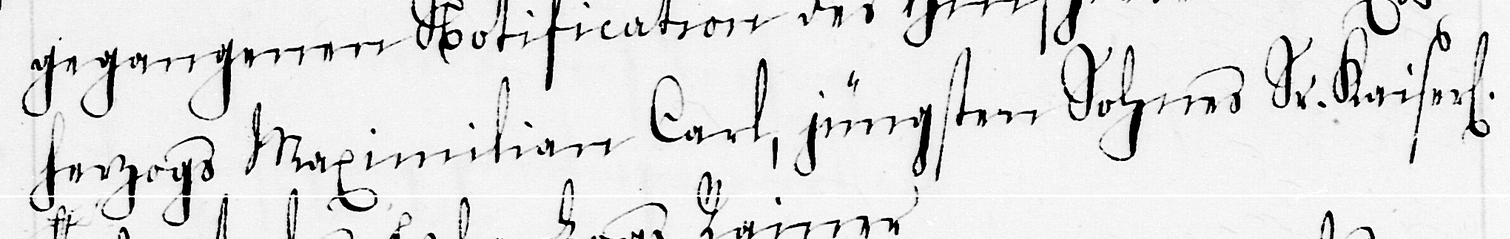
herzogs [sic!] Maximilian Carl, jüngsten Sohnes Sr. Kaiserl.
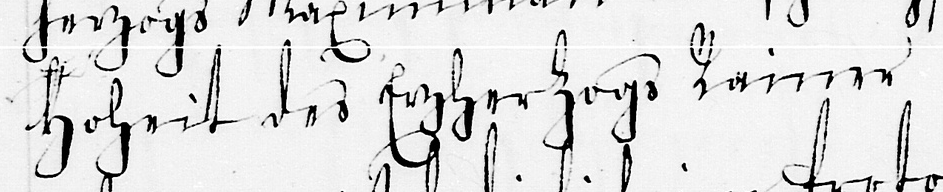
Hoheit des Erzherzogs Rainer
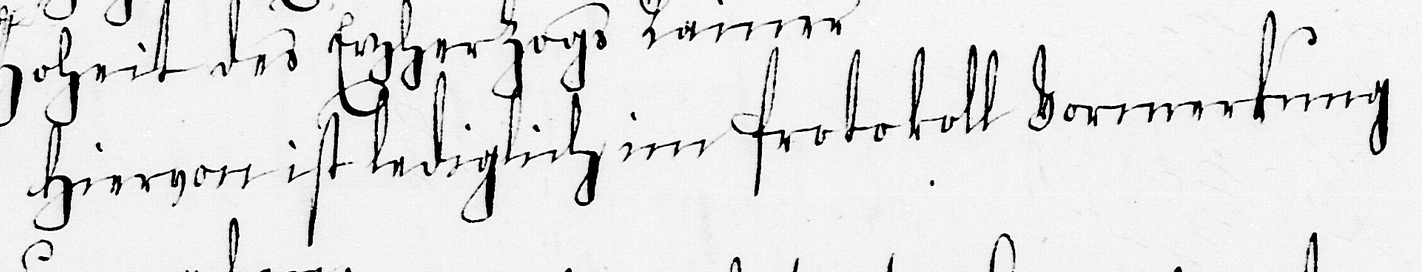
Hiervon ist lediglich im Protokoll Vormerkung
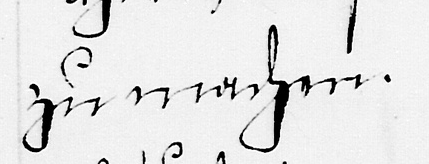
zu machen.
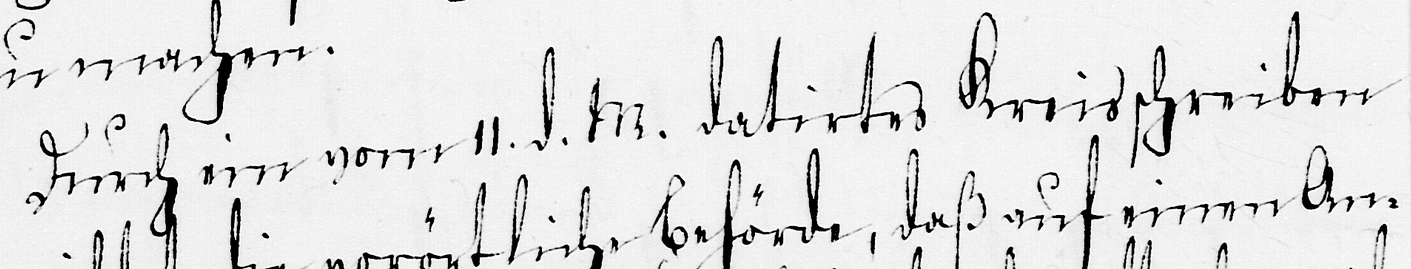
Durch ein vom 11. d. M. datirtes Kreisschreiben
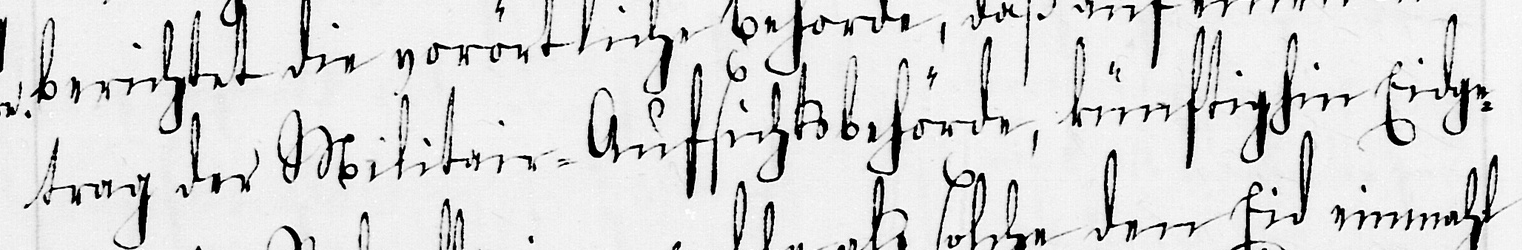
trag der Militair-Aufsichtsbehörde, künftighin Eidge¬
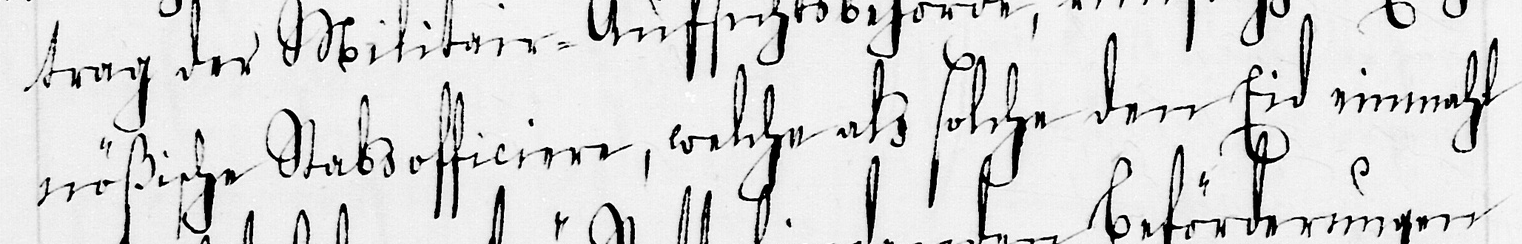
nößische Stabsofficiere, welche als solche den Eid einmahl
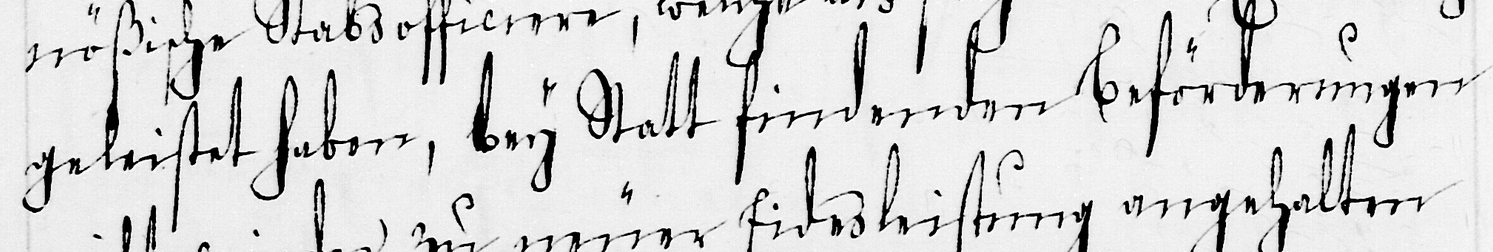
geleistet haben, bey Statt findenden Beförderungen
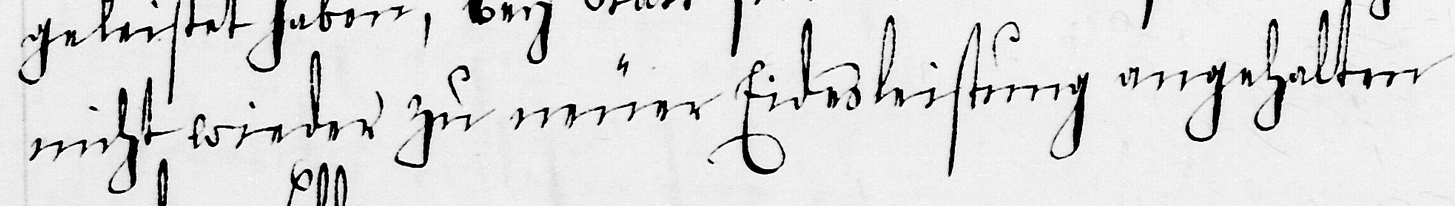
nicht wieder zu neuer Eidesleistung angehalten
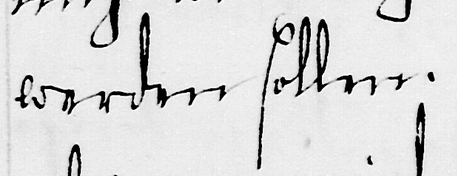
werden sollen.
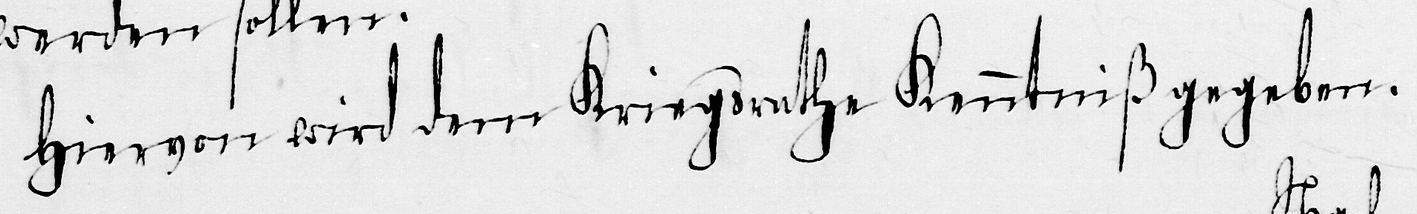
Hiervon wird dem Kriegsrathe Kenntniß gegeben.
